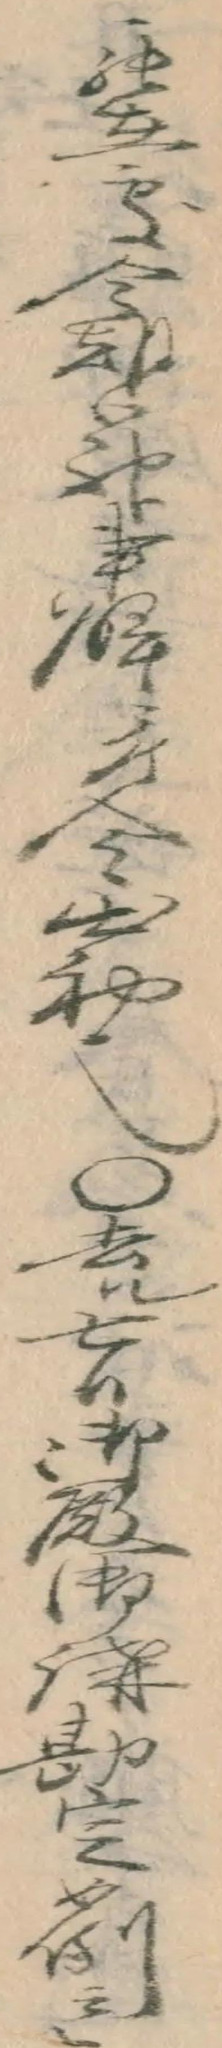罷在處今朝御神事解ニ付令出勤也○去ル七日御殿御講勘定如例云々
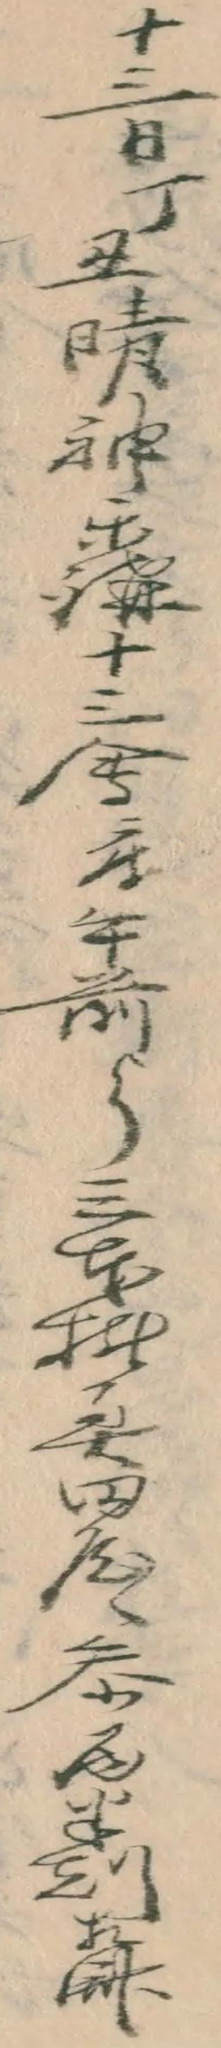十三日丁丑晴神楽講十三會ニ付午前より三本枡奥田屋へ参酉半刻相済
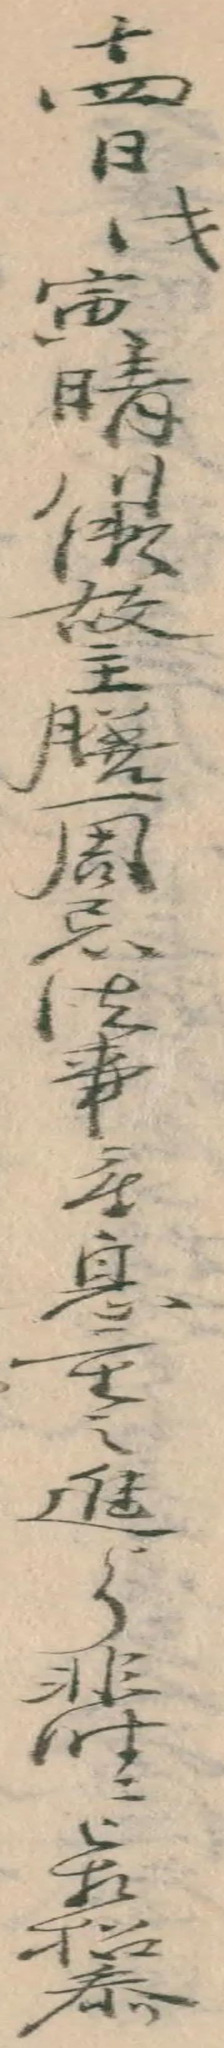十四日戊寅晴川瀬故主膳一周忌法事ニ付息重之進より非時ニ被相招参
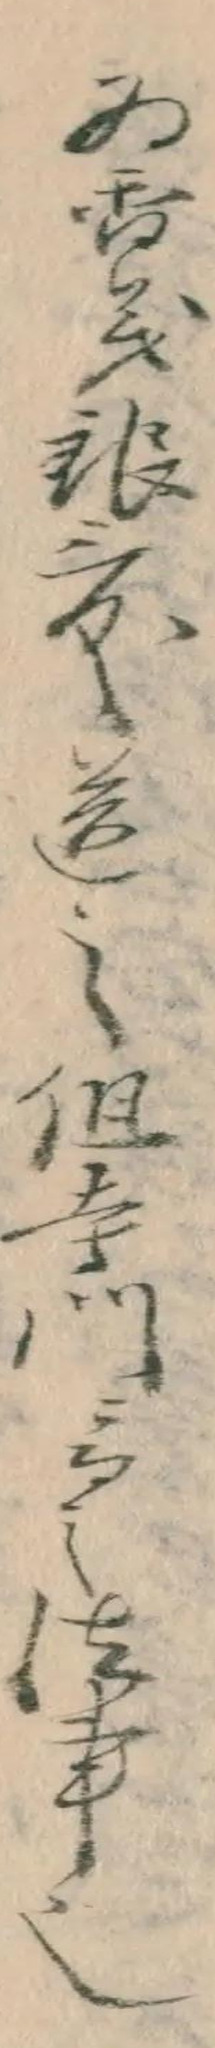為香義銀三匁送之但寺門ニ而之法事也
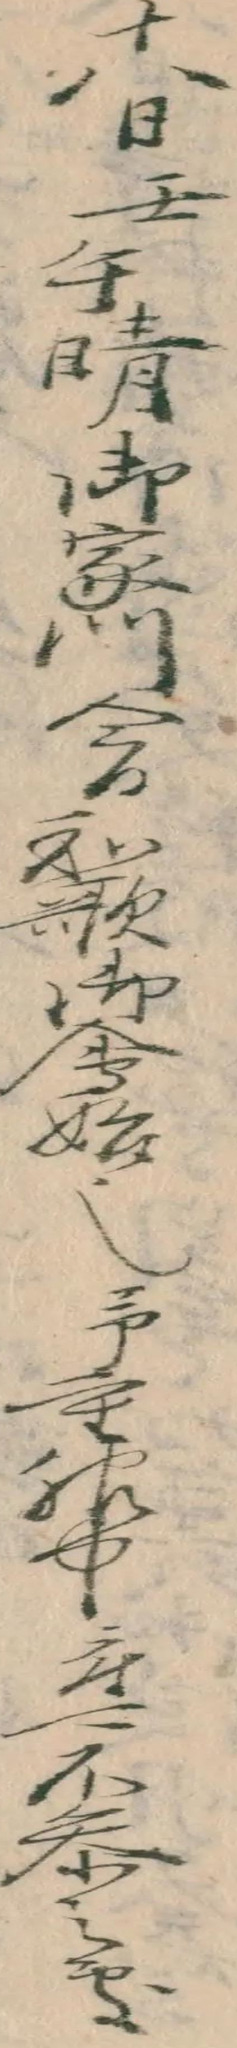十八日壬午晴御家門今日和歌御會始也予重服中ニ付可不参之處
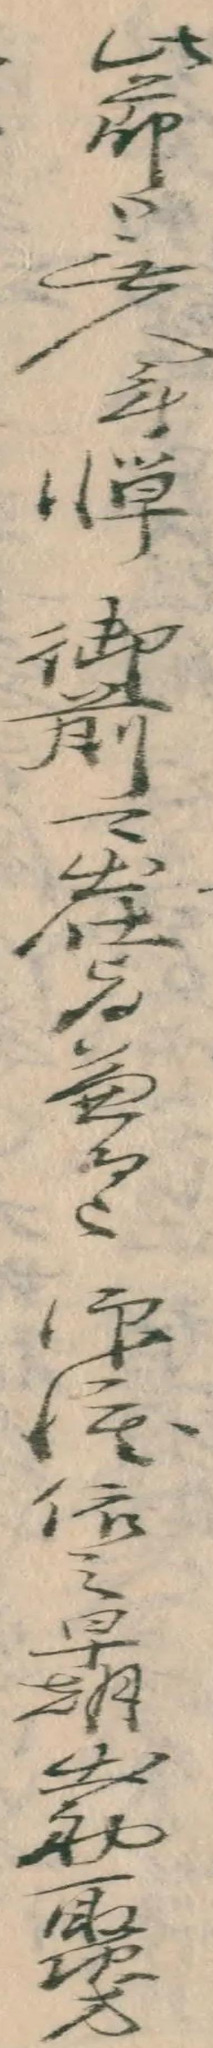此節御無人ニ付憚御前可出仕旨兼而被仰渡依之早朝出勤取次方
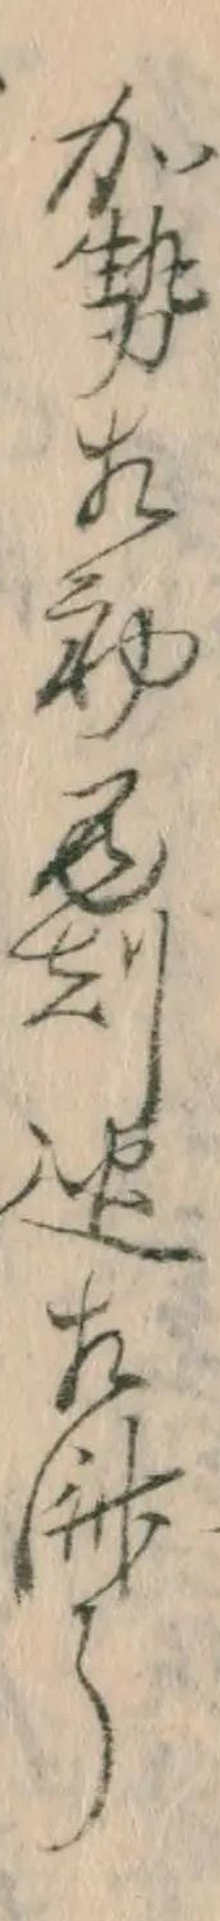加勢相勤酉刻過相済了
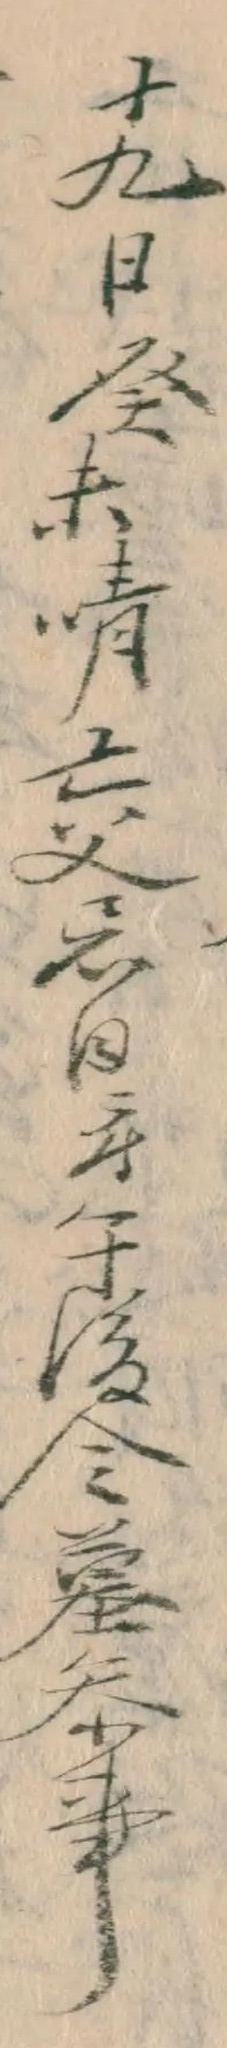十九日癸未晴亡父忌日ニ付午後令墓参事
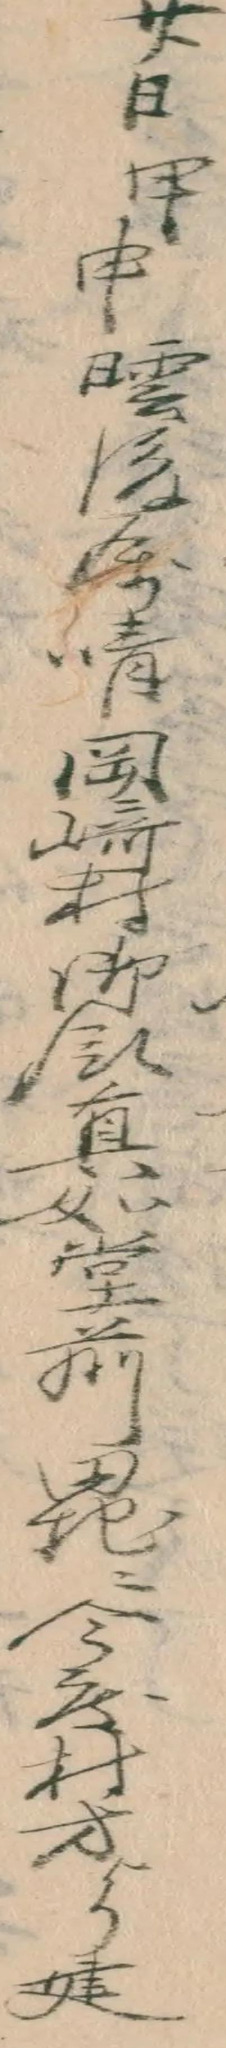廿日甲申曇後属岡崎村御領真如堂前田地ニ今度村方より建
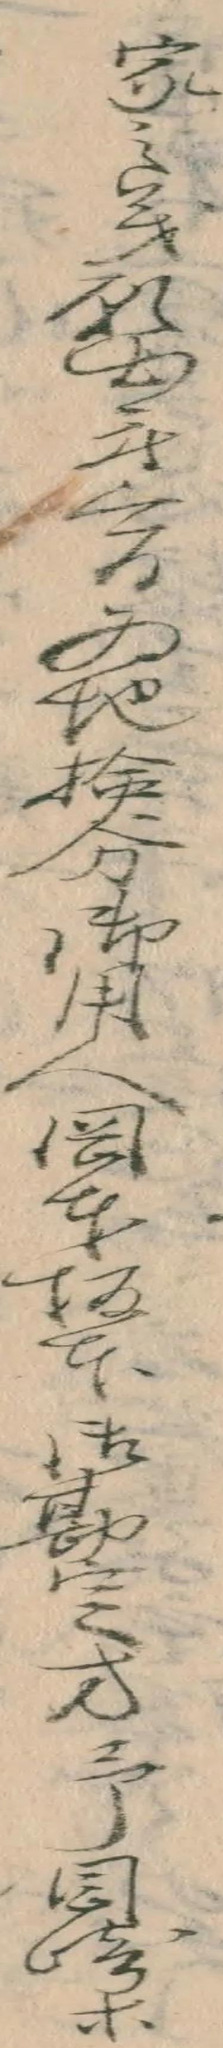家之義願出ニ付今日為地検分御用人岡本坂本御勘定方予岡崎等
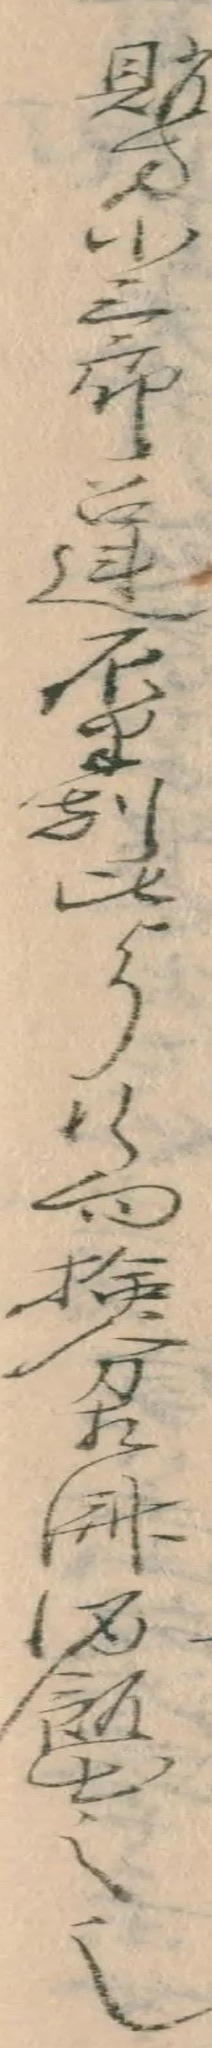賄方小三郎召連辰半刻比より引向検分相済酒飯出之也
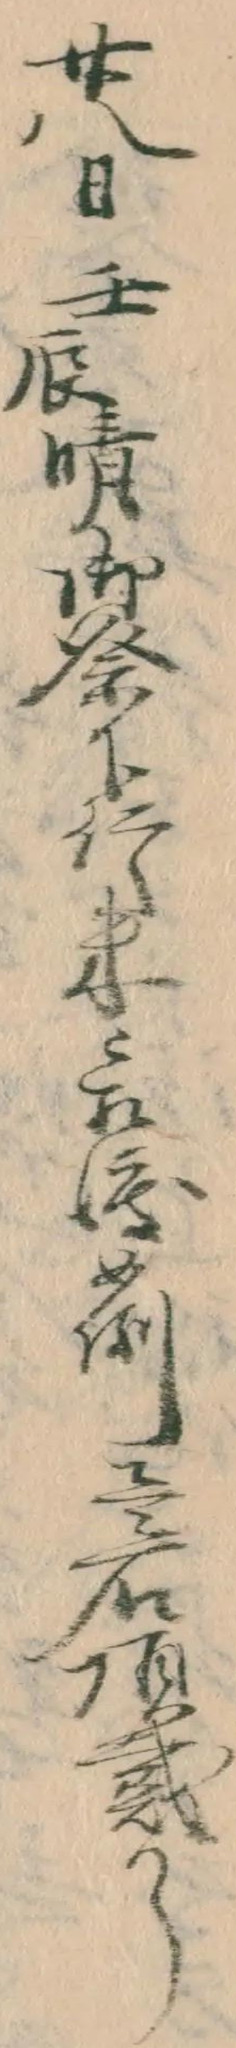廿八日壬辰晴御祭下行来被相渡如例壱石頂戴了
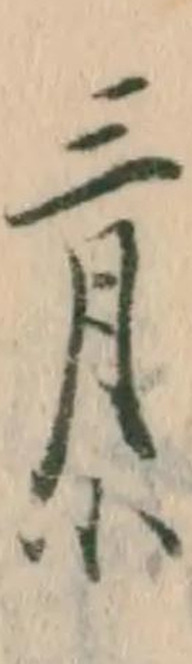三月小
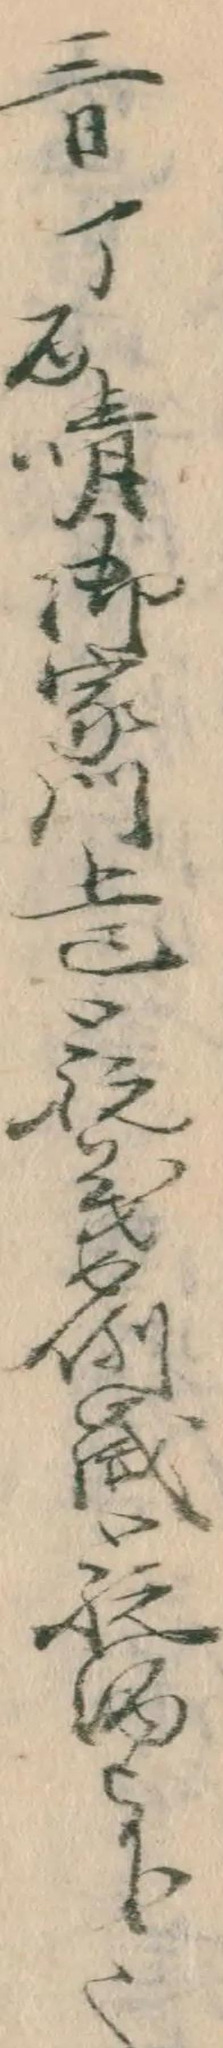三日丁酉晴御家門上巳御祝義如例歳御祝酒被下也
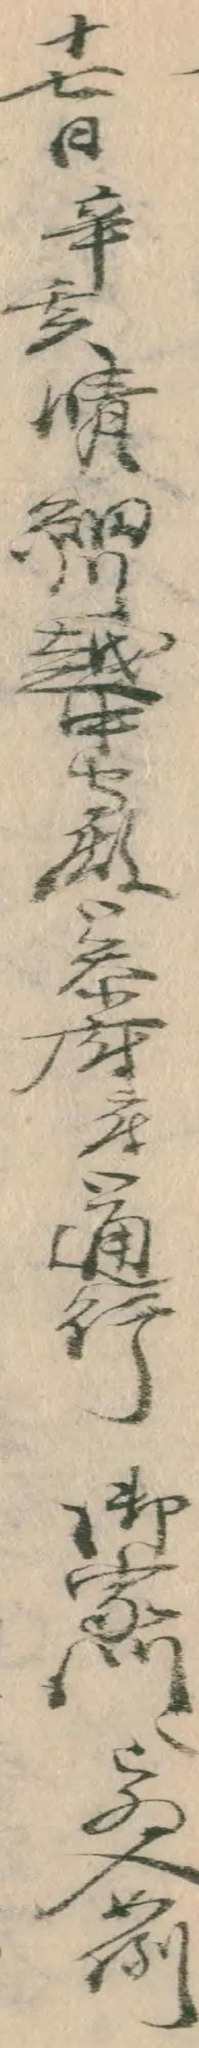十七日辛亥晴細川越中守殿御参府ニ付御通行御家門へ被為入如例
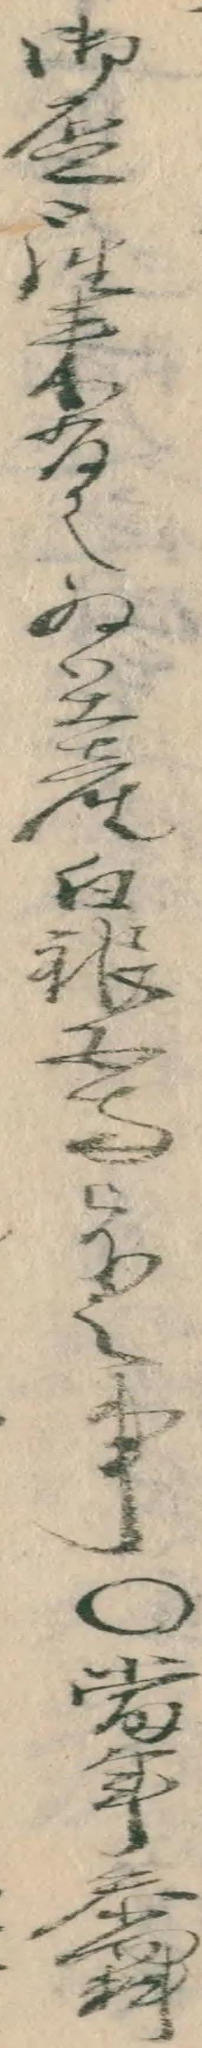御盃御往来有之為御土産白銀五両被下之事○當年参向料
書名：賀茂社記録. 第65冊
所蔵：国立国会図書館 National Diet Library, JAPAN
